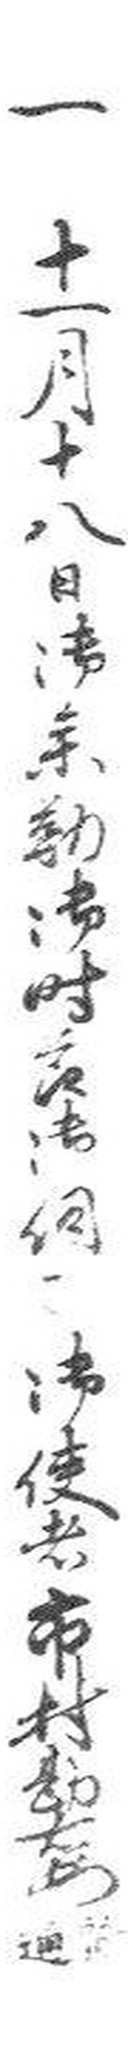一十一月十八日御参勤御時節御伺之御使者市村勘右衛門賢通
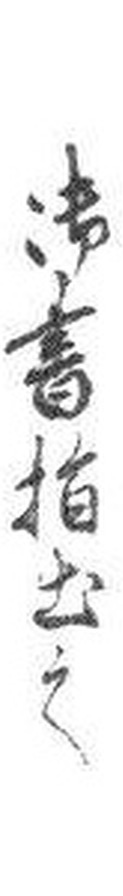御書指出之
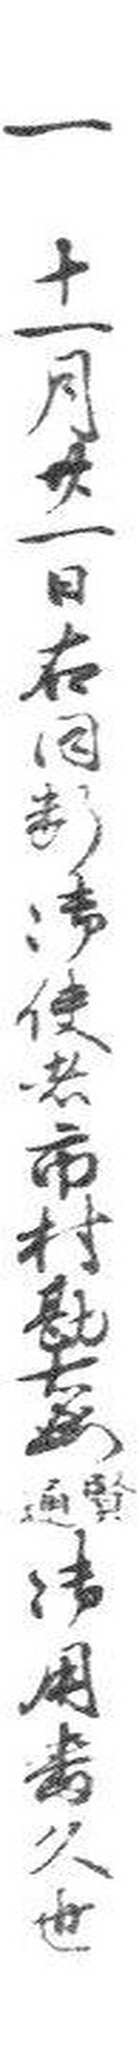一十一月廿一日右同断御使者市村勘右衛門賢通御用番久世
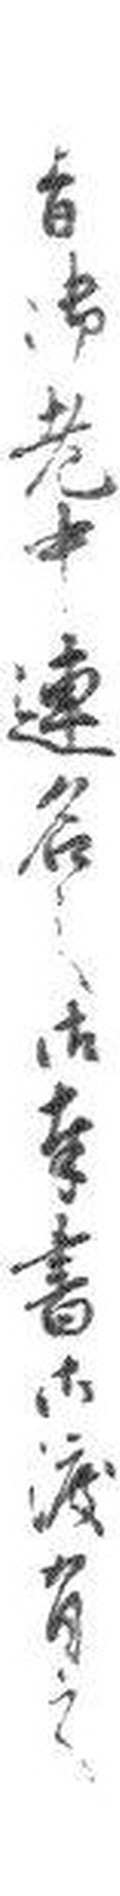旨御老中連名之御奉書御渡有之
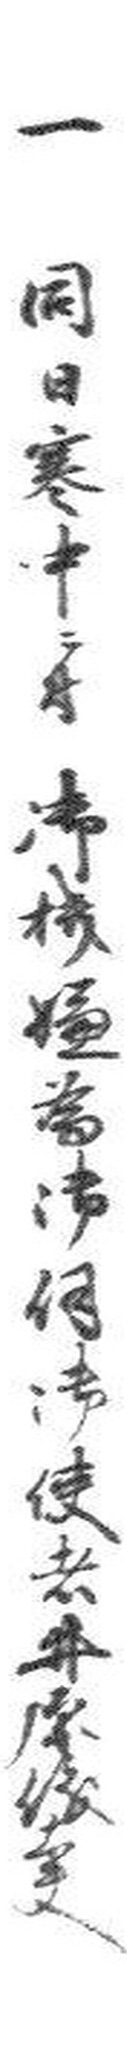一同日寒中ニ付御機嫌為御伺御使者井原儀太夫
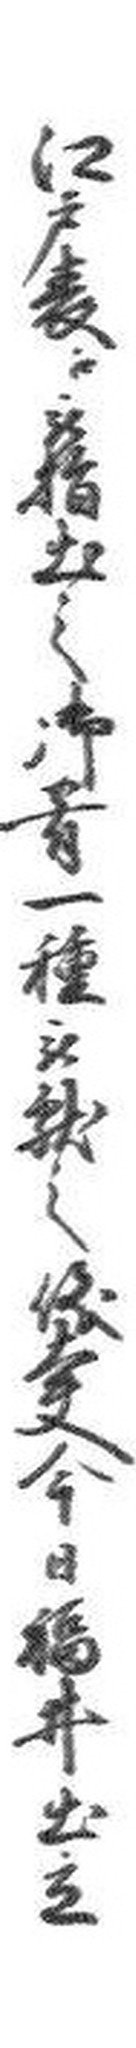江戸表江被指出之御肴一種被献之儀太夫今日福井出立
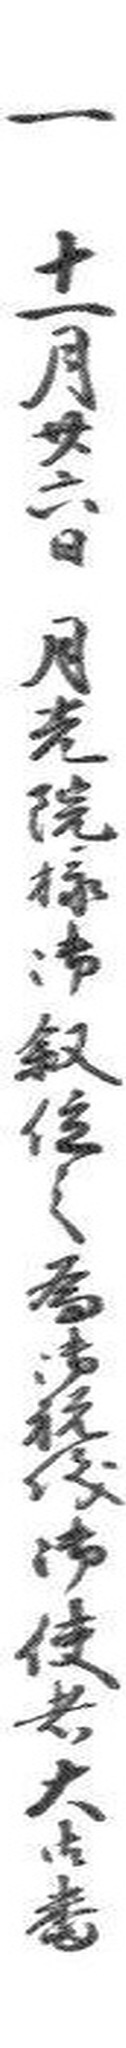一十一月廿六日月光院様御叙位之為御祝儀御使者大御番
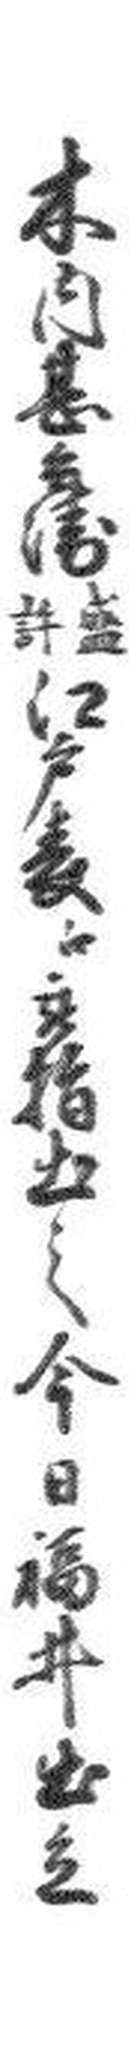木内甚兵衛盛許江戸表江被指出之今日福井出立
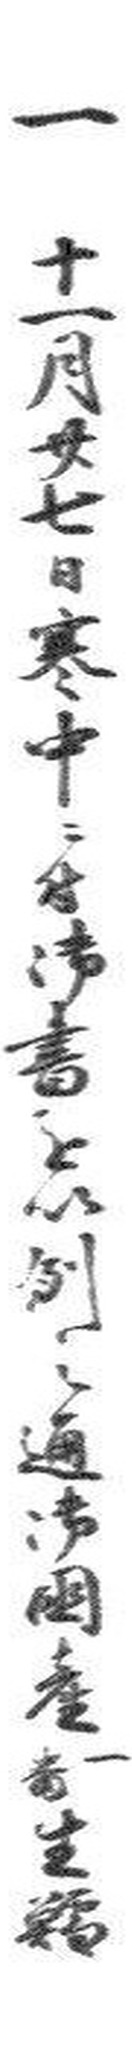一十一月廿七日寒中ニ付御書を以例之通御国産一番生鱈
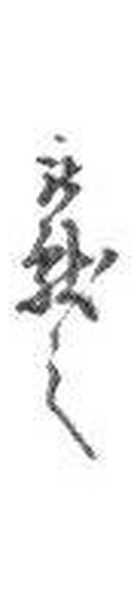被献之
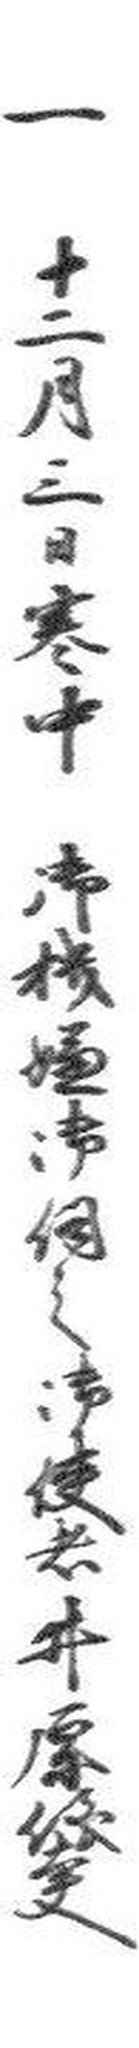一十二月三日寒中御機嫌御伺之御使者井原儀太夫
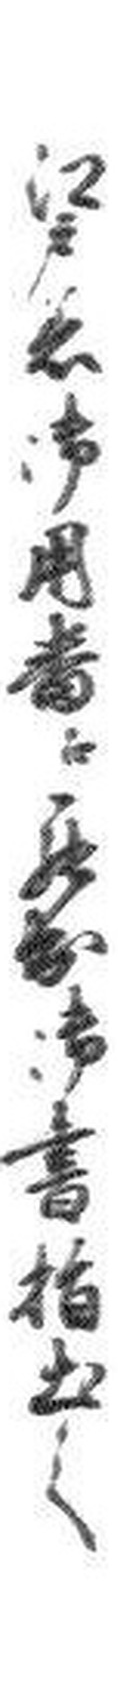江戸着御用番江罷出御書指出之
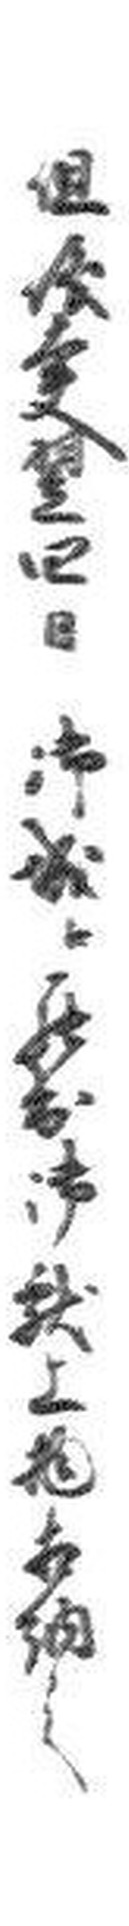但儀太夫翌四日御城江罷出御献上物相納之

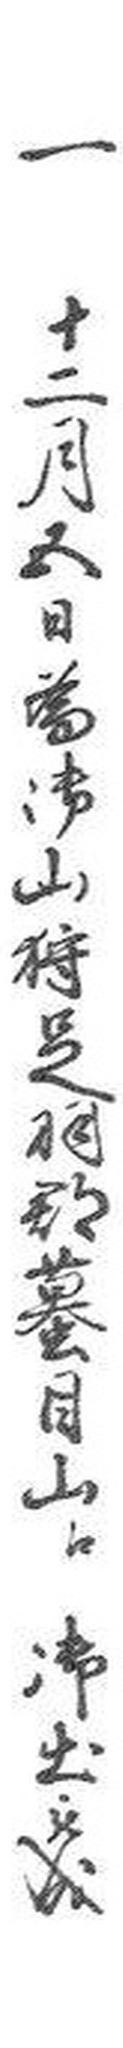一十二月五日為御山狩足羽郡蟇目山江御出被成
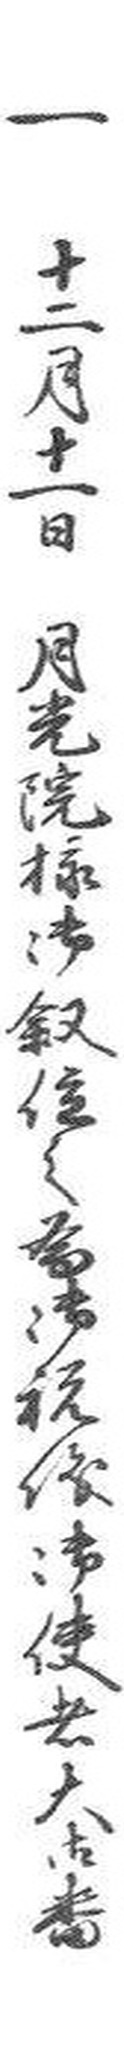一十二月十一日月光院様御叙位之為御祝儀御使者大御番
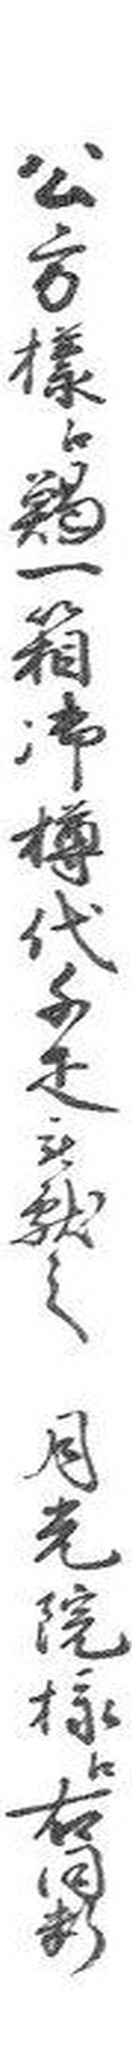一公方様江鶏一箱御樽代千疋被献之月光院様江右同断
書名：家譜 二十九 吉邦公 従正徳二年到正徳三年
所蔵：福井県文書館 Fukui Prefectural Archives
